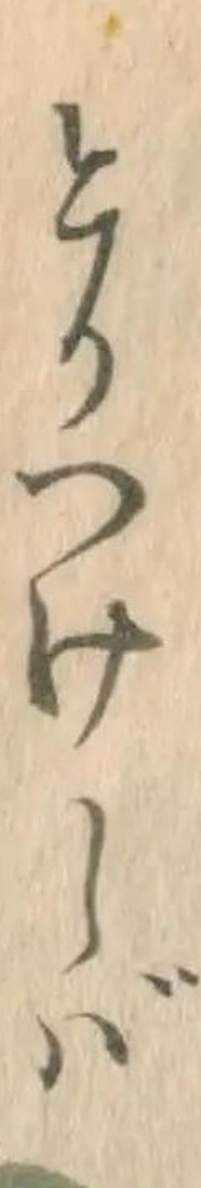とりつけしば
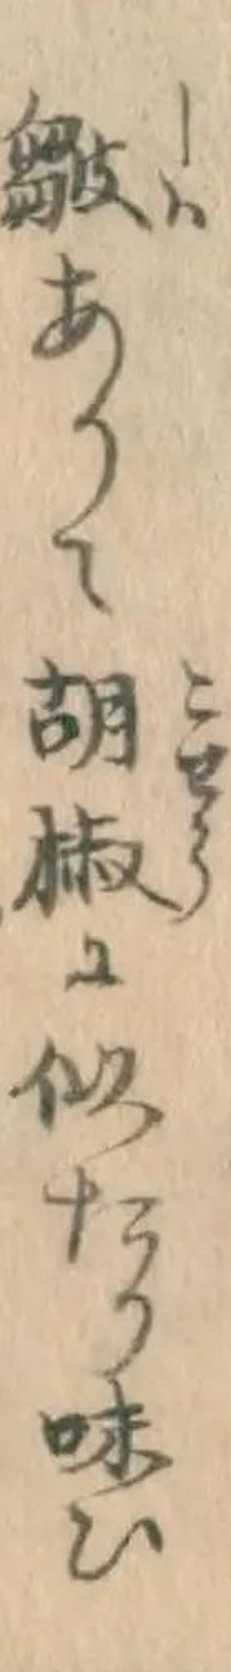皺ありて胡椒に似たり味ひ
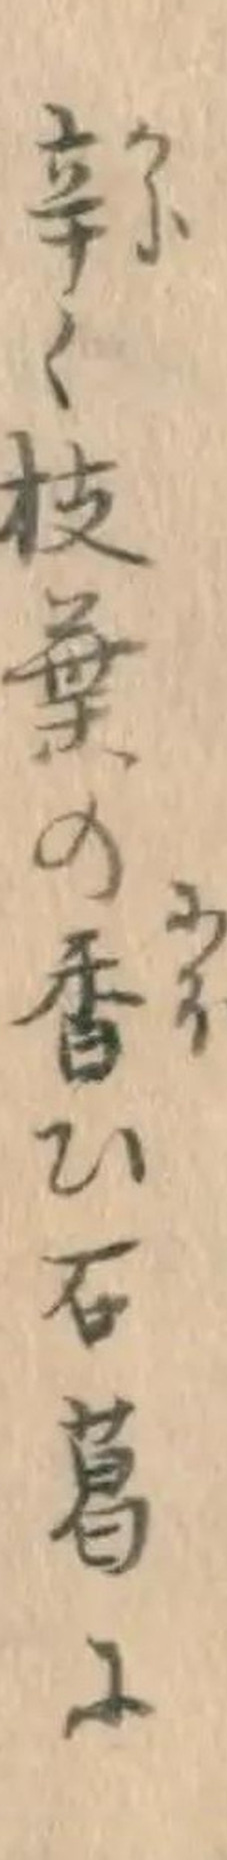辛く枝葉の香ひ石葛に
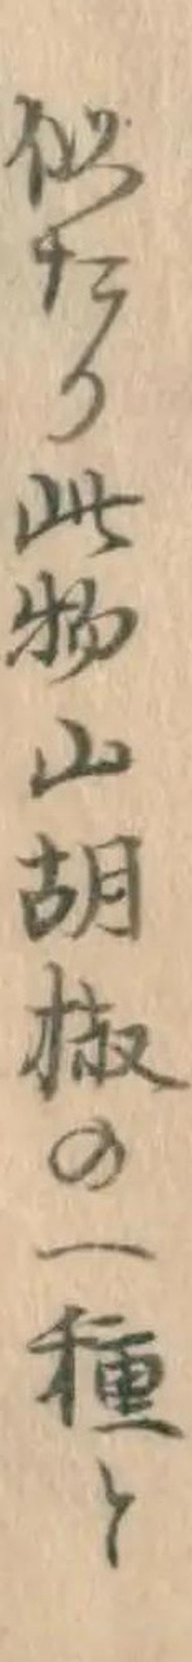似たり此物山胡椒の一種と
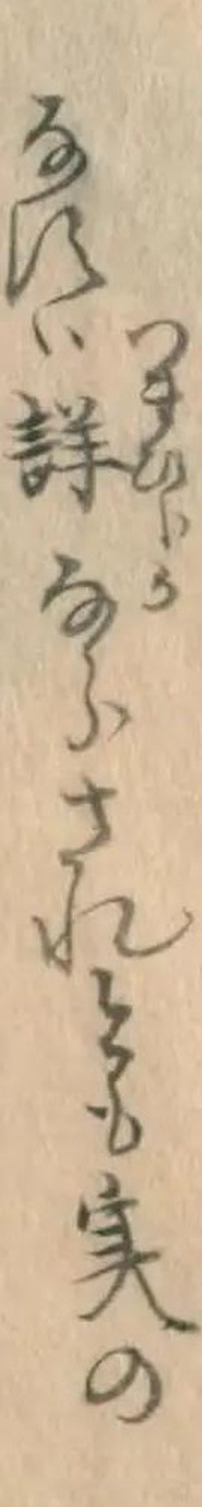なすは詳ならされとも実の
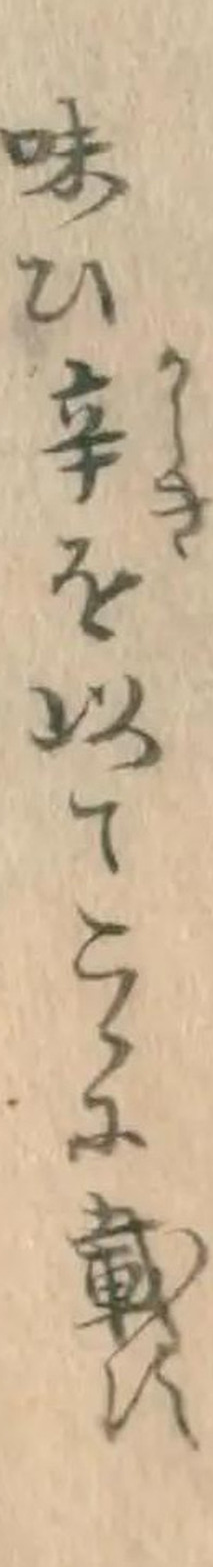味ひ辛を以てこゝに載す

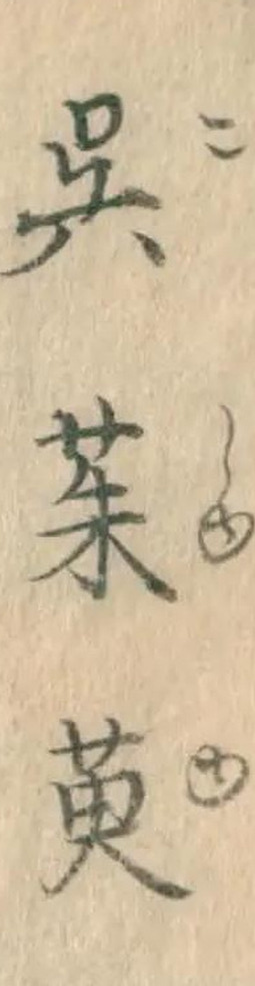呉茱臾
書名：本草図譜. 巻70-72
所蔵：国立国会図書館 National Diet Library, JAPAN
